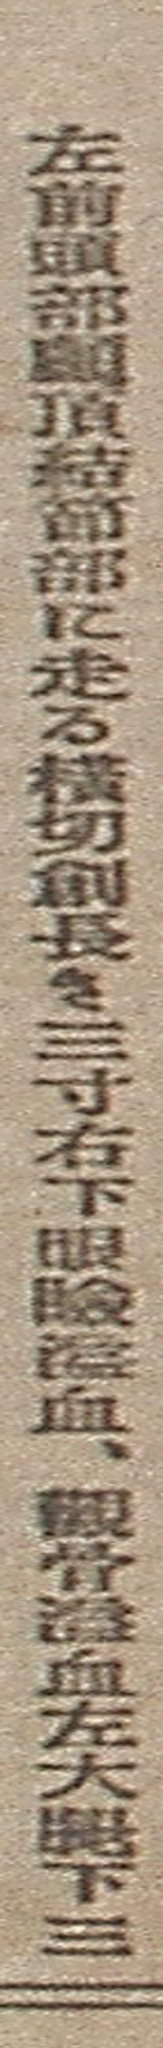左前頭部頗頂結節部に走る横切創長さ三寸右下眼瞼溢血、観骨溢血左大腿下三
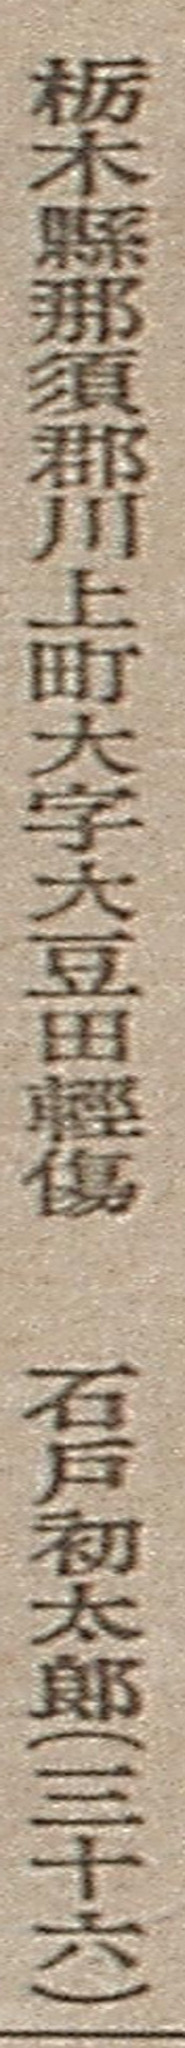栃木県那須郡川上町大字大豆田軽傷石戸初太郎
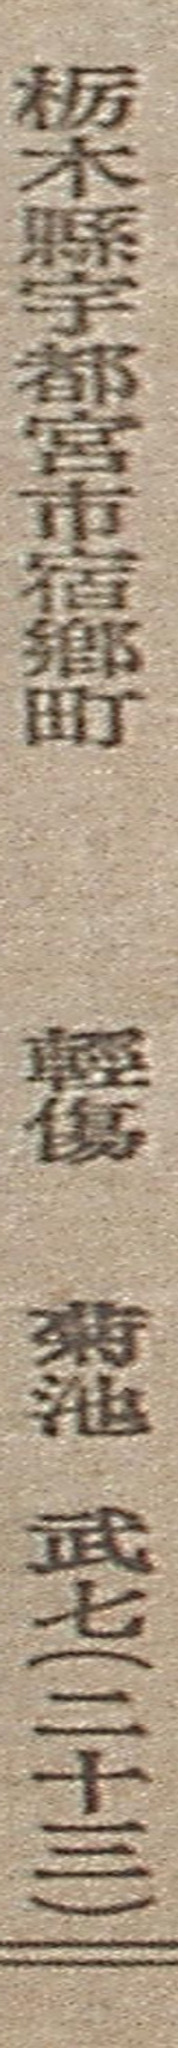栃木県宇都宮市宿郷町軽傷菊池武七
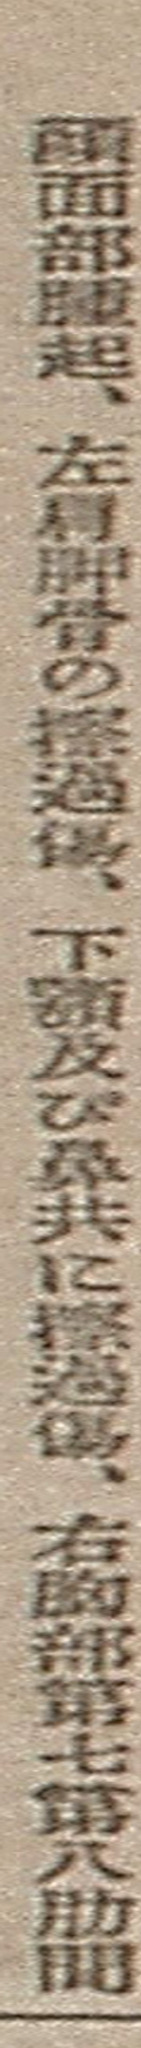顔面部腫起、左肩胛骨の擦過傷、下顎及び鼻共に擦過傷、右胸部第七第八肋間
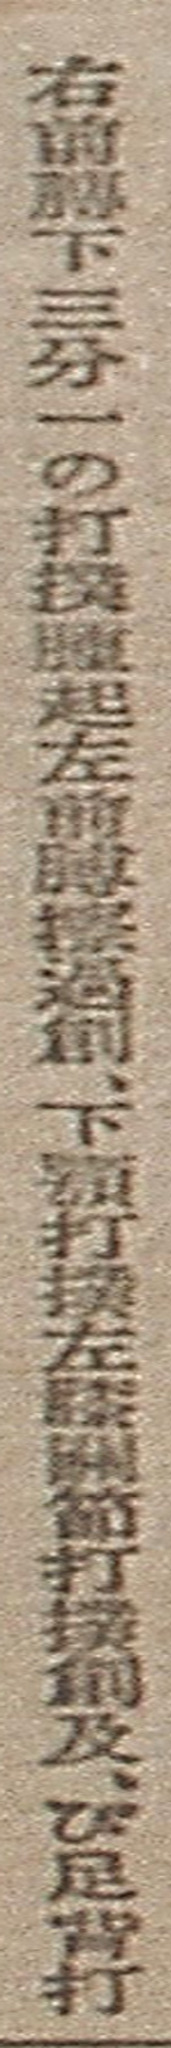右前膊下三分の一の打撲腫起左前膊擦過創、下顎打撲左膝関節打撲創及、び足背打
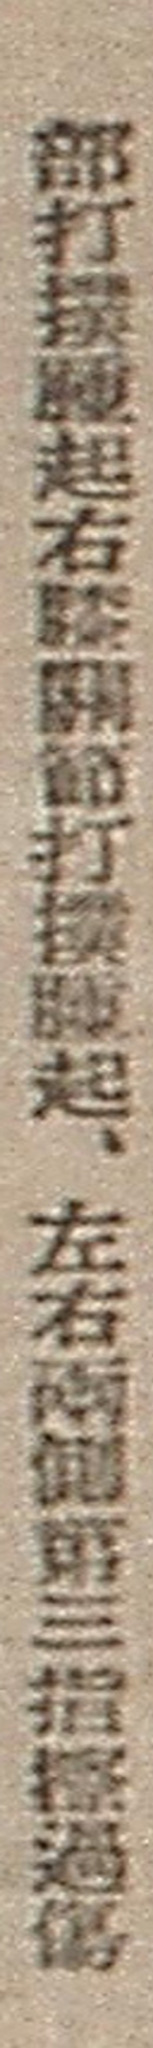部打撲腫起右膝関節打撲腫起、左右両側第三指擦過傷
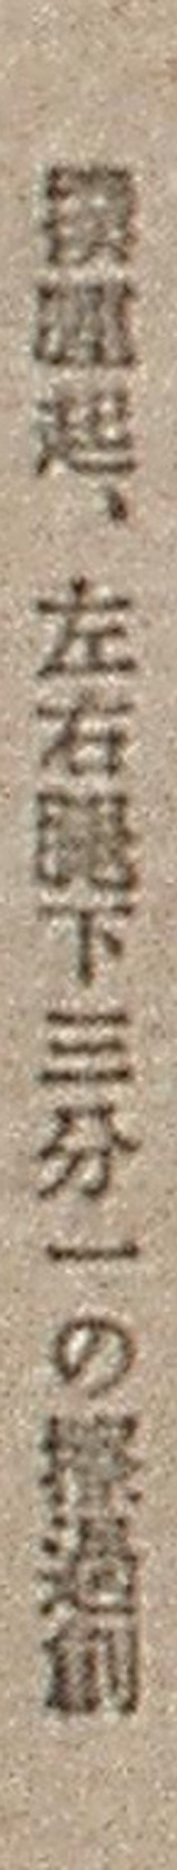撲腫起、左右腿下三分の一の擦過創

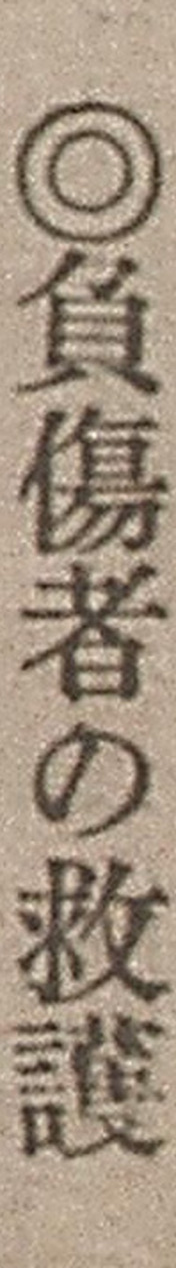◎負傷者の救護
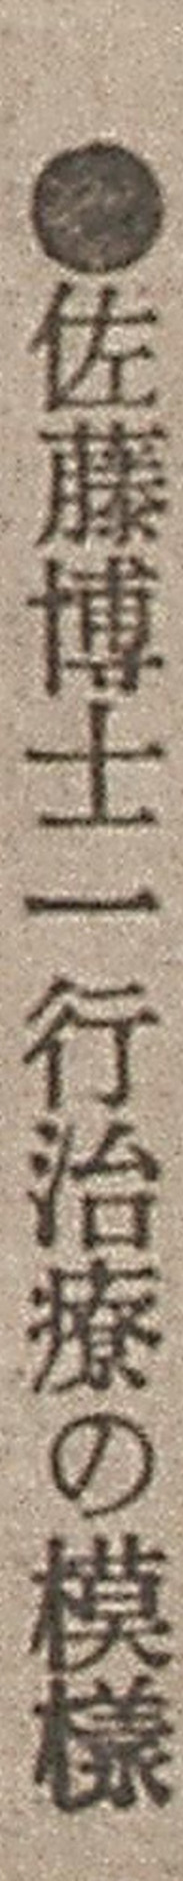●佐藤博士一行治療の模様
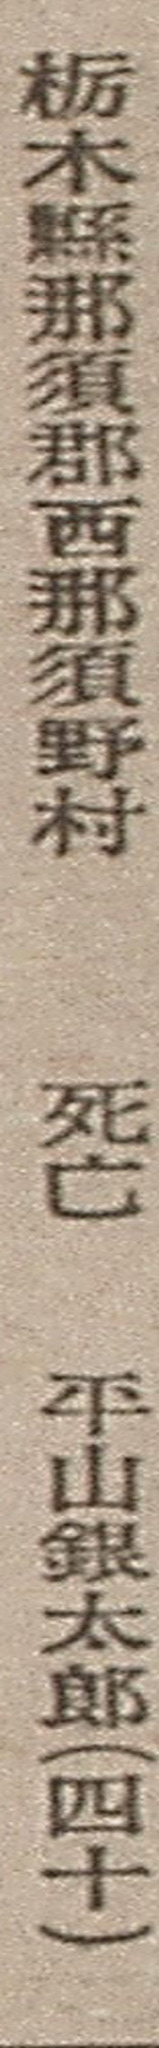栃木県那須郡西那須野村死亡平山銀太郎
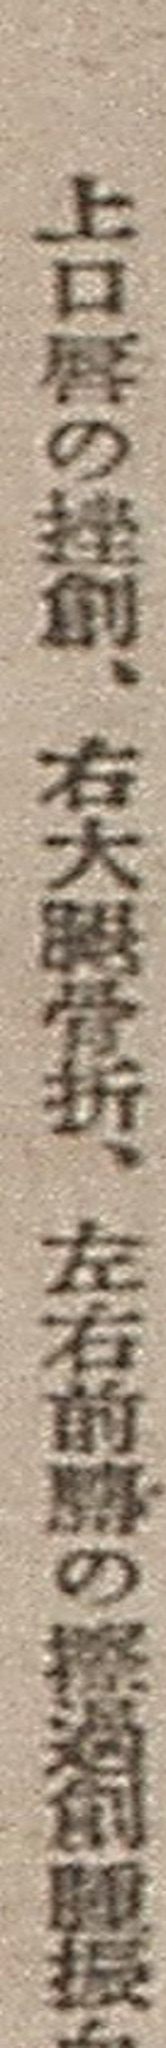上口唇の挫創、右大腿骨折、左右前膞の擦過創腫振血
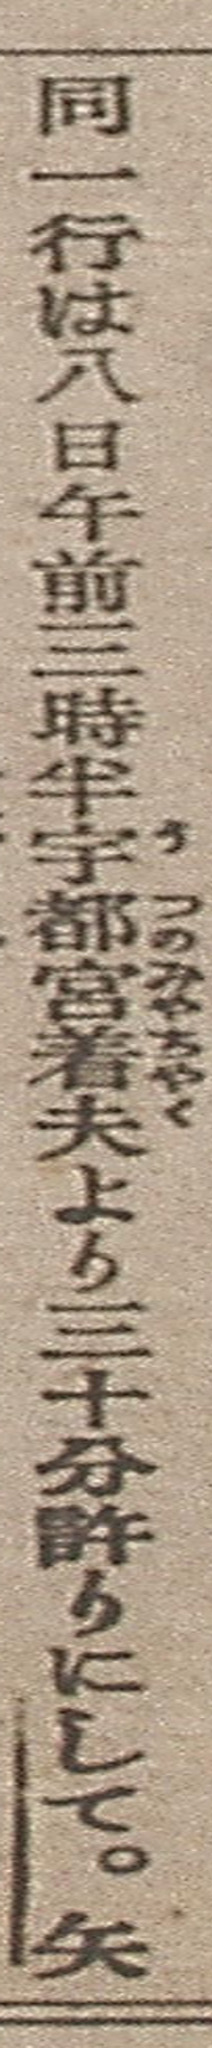同一行は八日午前三時半宇都宮着夫より三十分許りにして。矢
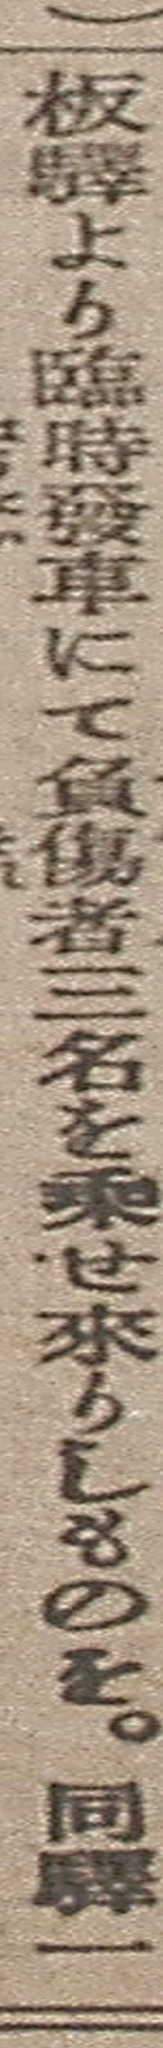板駅より臨時発車にて負傷者三名を乗せ来りしものを。同駅一
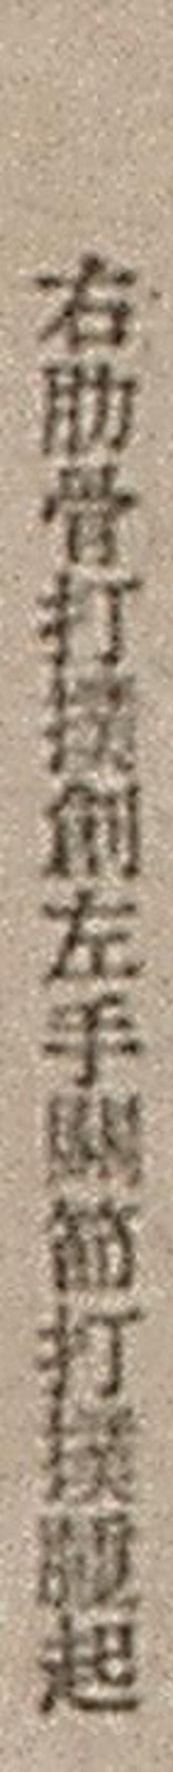右肋骨打撲創左手関節打撲腫起
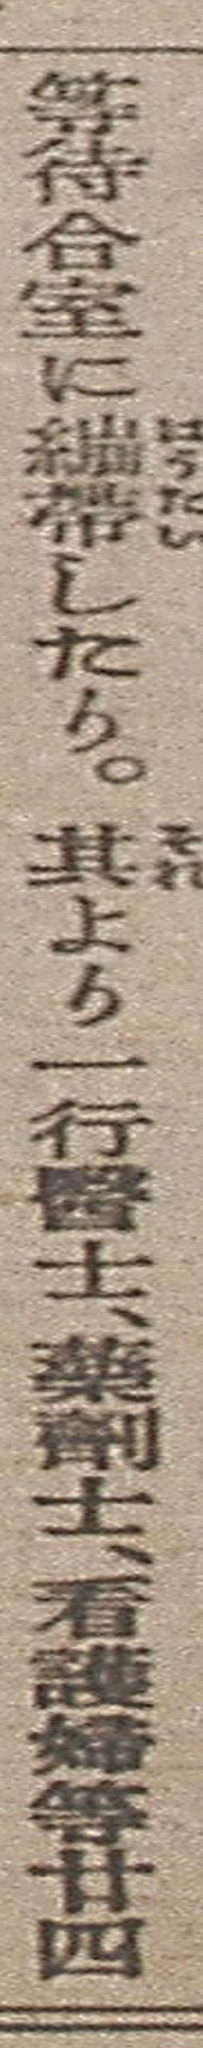等待合室に繃帯したり。其より一行医士、薬剤士、看護婦等廿四
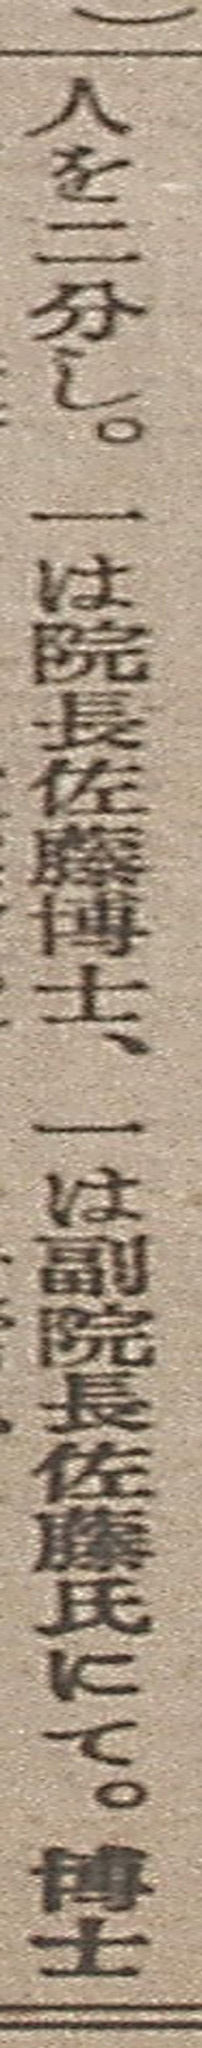人を二分し。一は院長佐藤博士、一は副院長佐藤氏にて。博士
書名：風俗畫報臨時増刊第百九十九號　明治三十二年十月各地災害圖會（前編之續）
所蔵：東京大学地震研究所図書室 Earthquake Research Institute Library, The University of Tokyo, JAPAN
